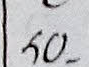50
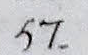57
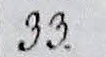33.
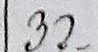32
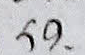59
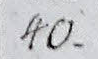40
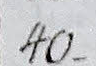40
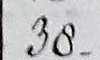38
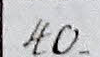40
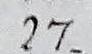27
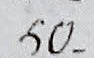50
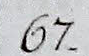67
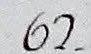62
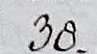38
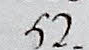52
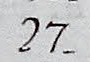27
